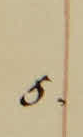5
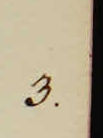3.
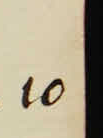10
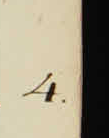4.
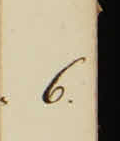6.
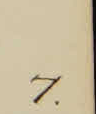7.
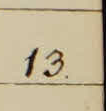13.
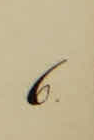6.
